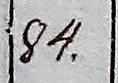84.
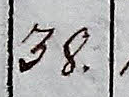38.
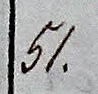51.
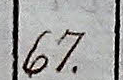67.
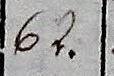62.
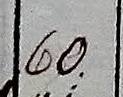60.
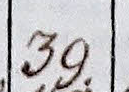39.
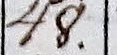48.
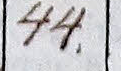44.
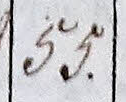55.
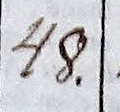48.
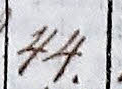44.
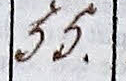55.
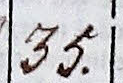35.
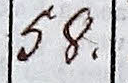58.
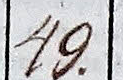49.
